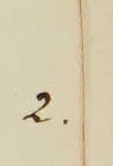2.
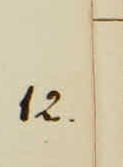12.
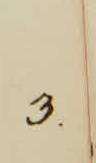3.
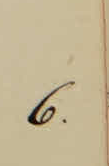6.
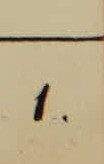1.
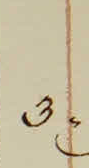3
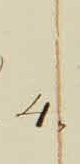4
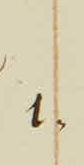1
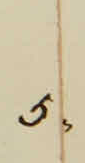5
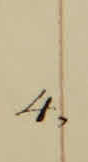4
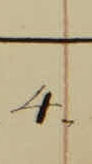4
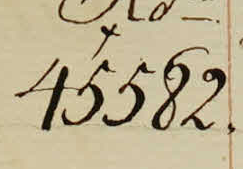45582
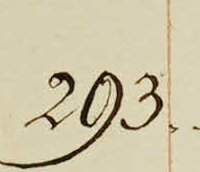293
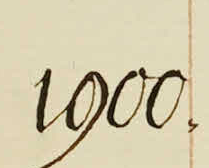1900
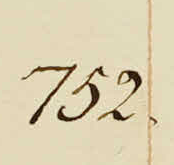752
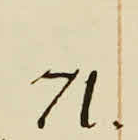71
